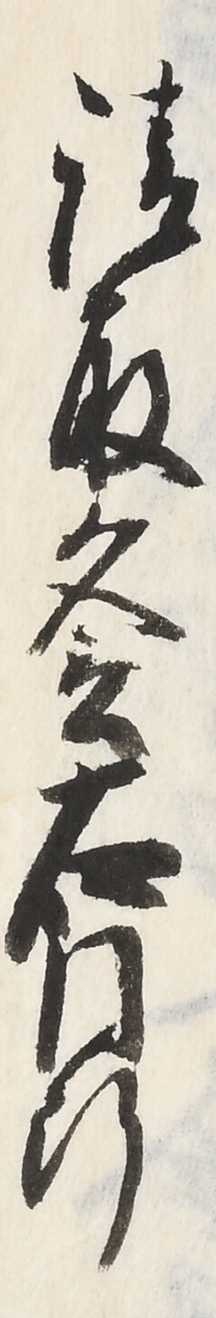請取文言右同断
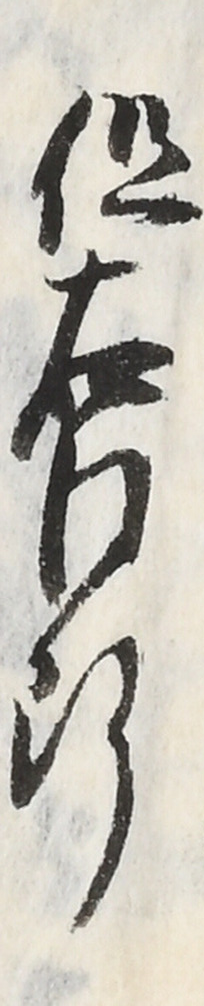但右同断
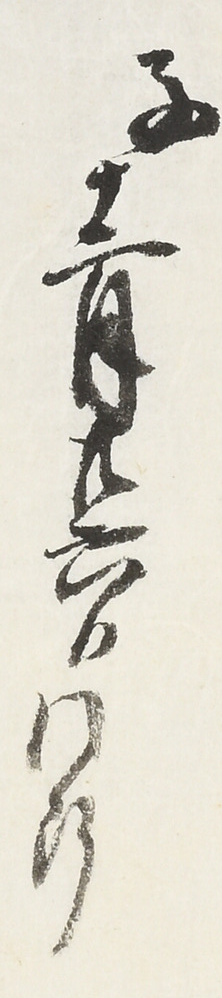十二月廿六日同断
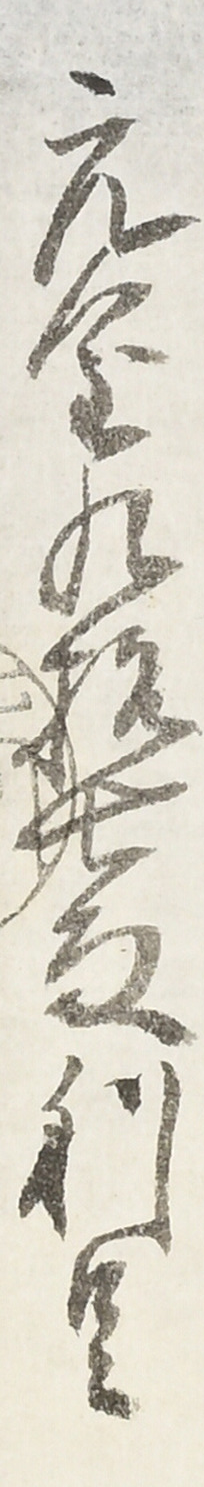元金九拾七両利足
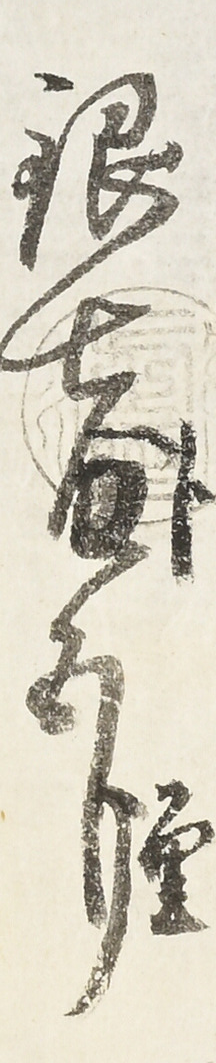銀七分五厘
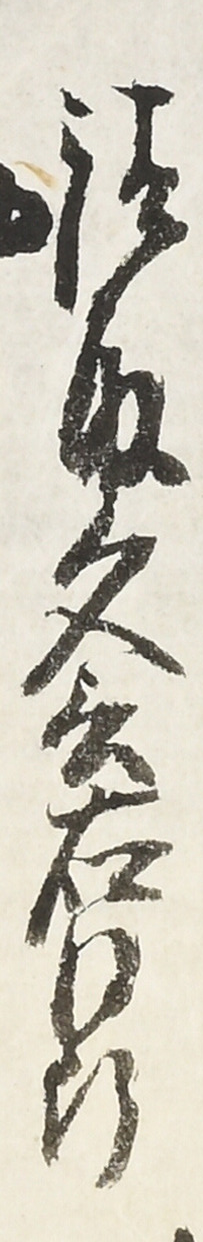請取文言右同断
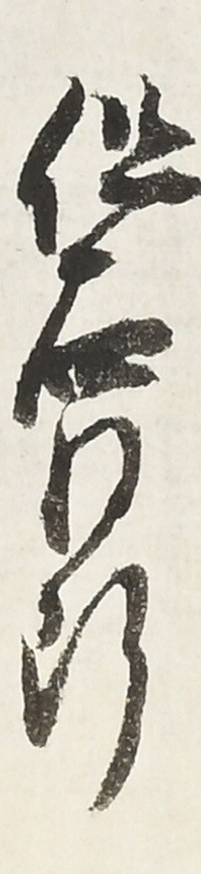但右同断
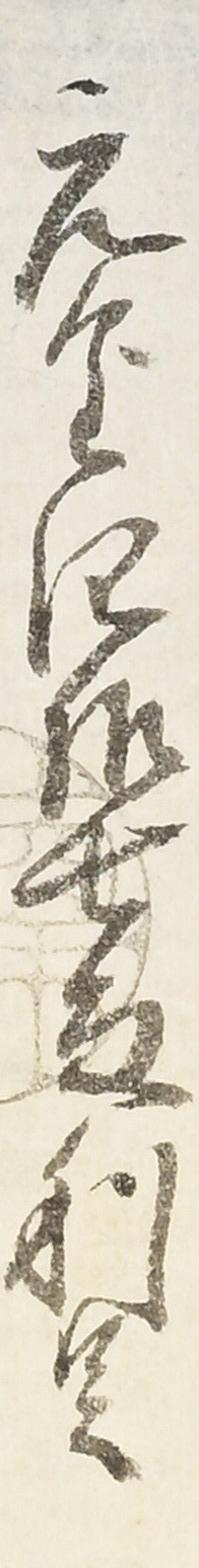元金四拾七両利足
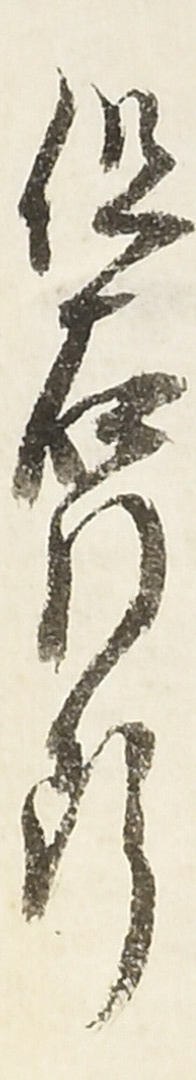但右同断
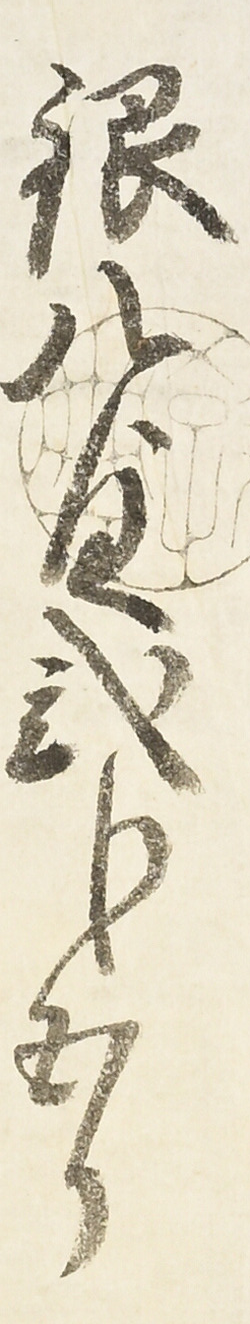銀八匁弐分五厘
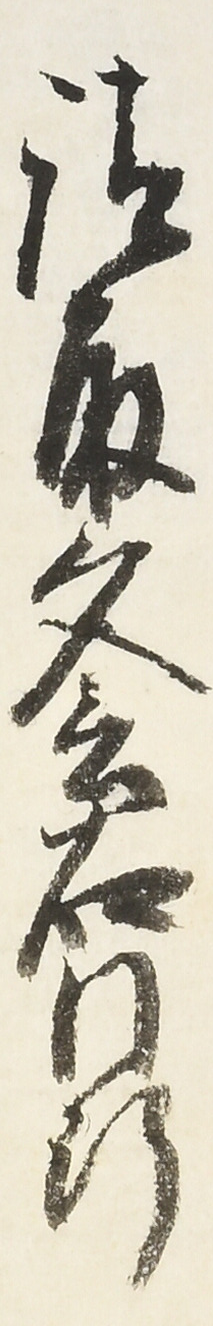請取文言右同断
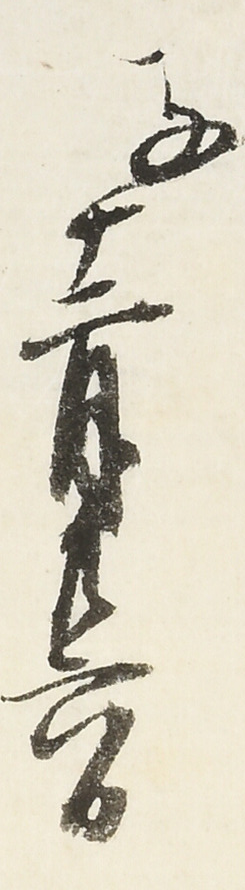十二月廿六日同断
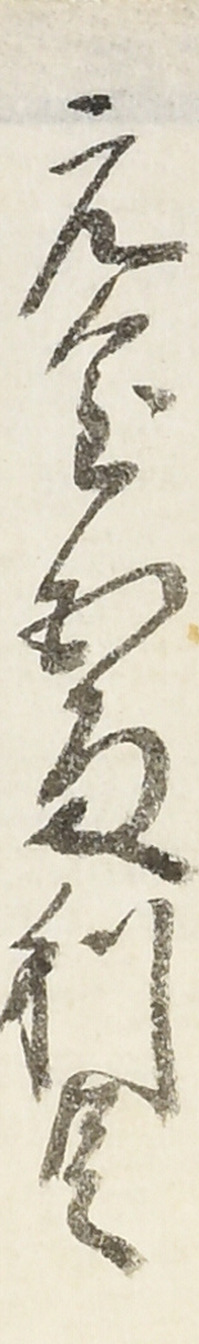元金五両利足
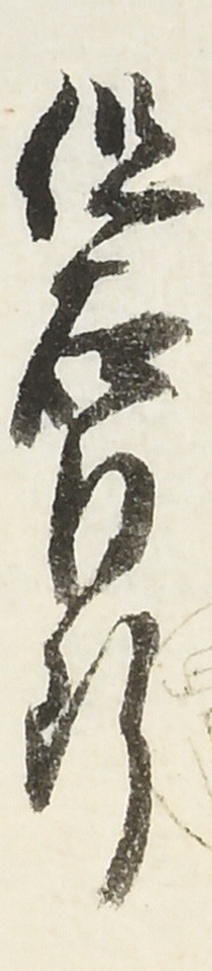但右同断
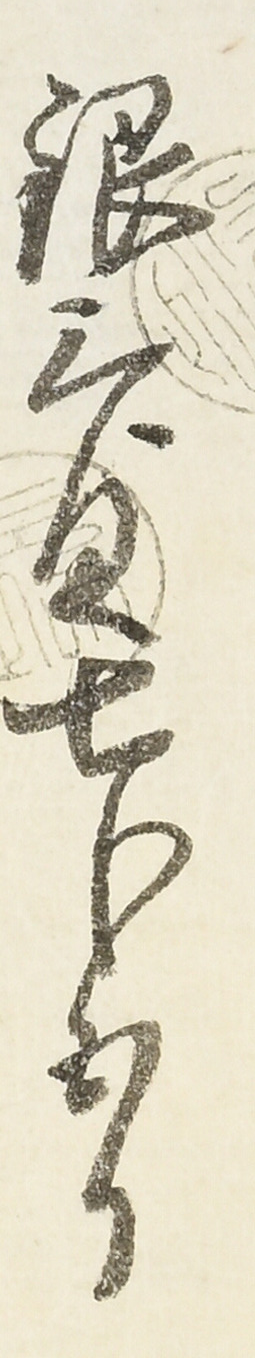銀三匁七分五厘
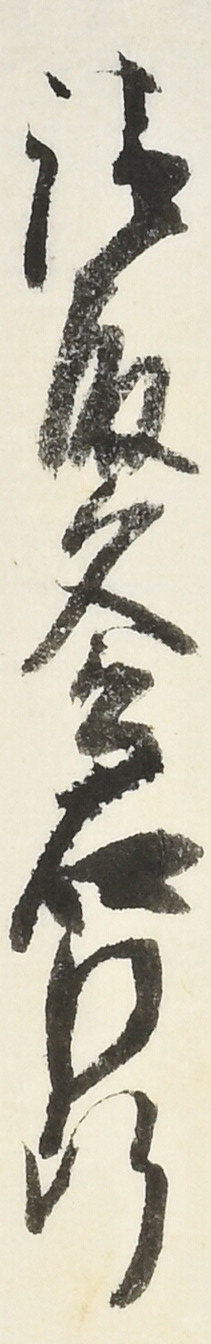請取文言右同断
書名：御乗出シ御才覚金割合扣帳
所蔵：伊那市立高遠町図書館・合同会社AMANE
